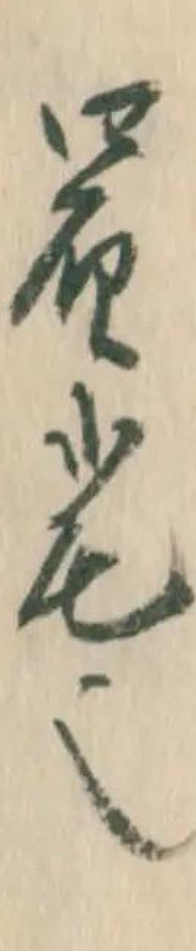四百弐毛也

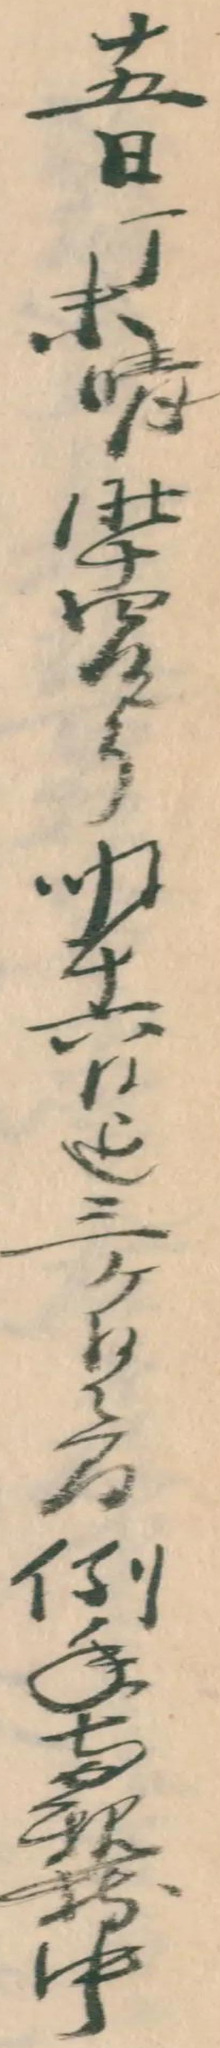十五日丁未晴昨十四日より明十六日迄三ヶ日之間例年両親持中
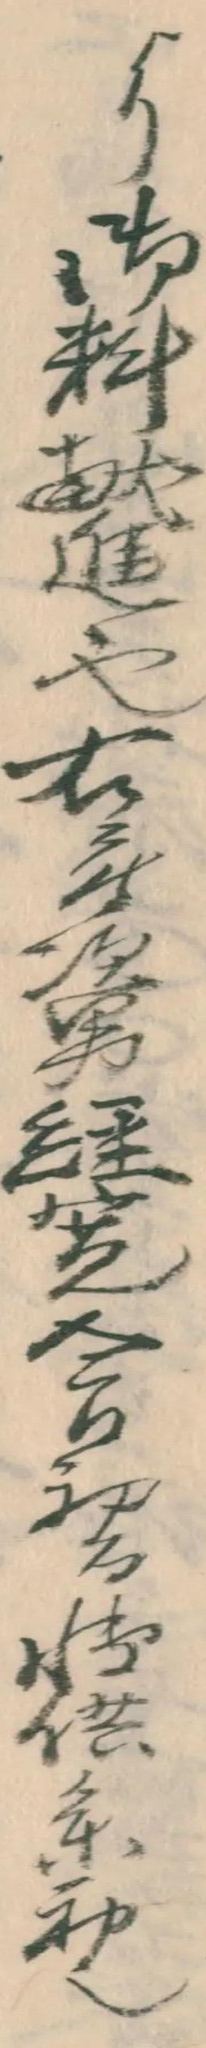より御料献進也右ニ付次男経寛今日初而轉供参勤也
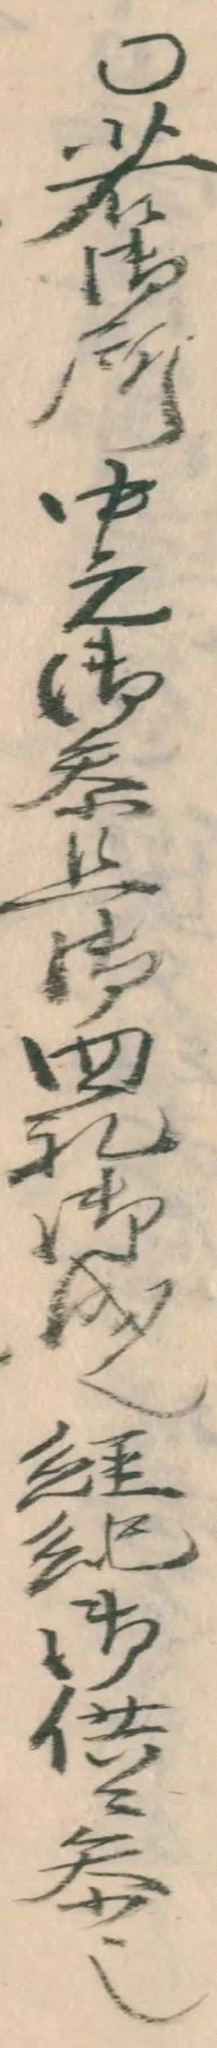○若御所中元御参且御回礼御成也経紀御供ニ参也
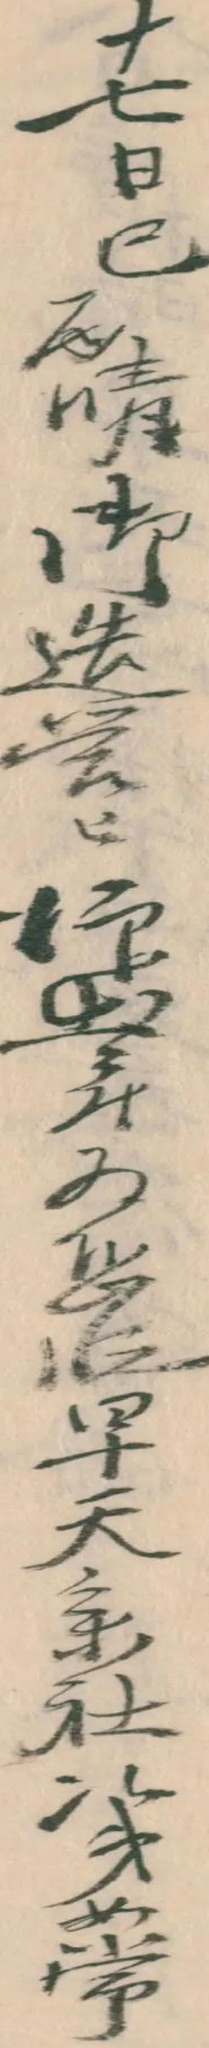十七日己酉晴御造営被仰出ニ付為恐悦早天参社次第如常
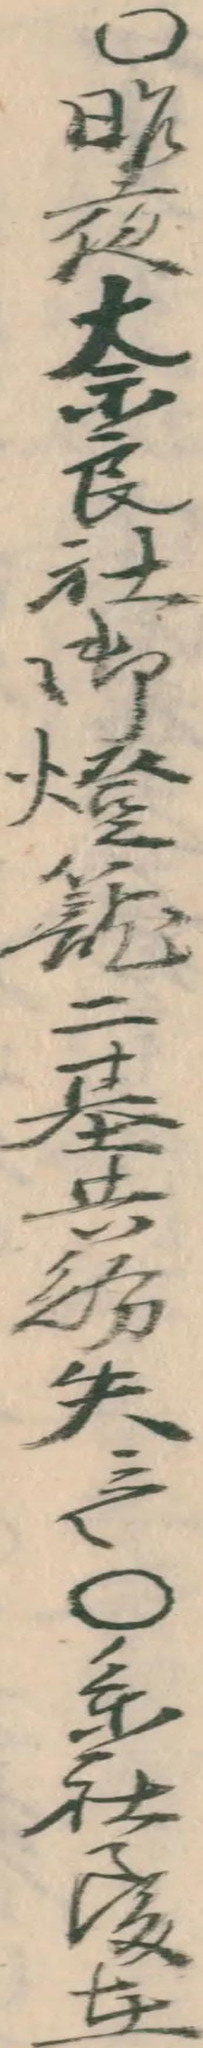○昨夜奈良社御燈籠二基共紛失云々○参社之後在
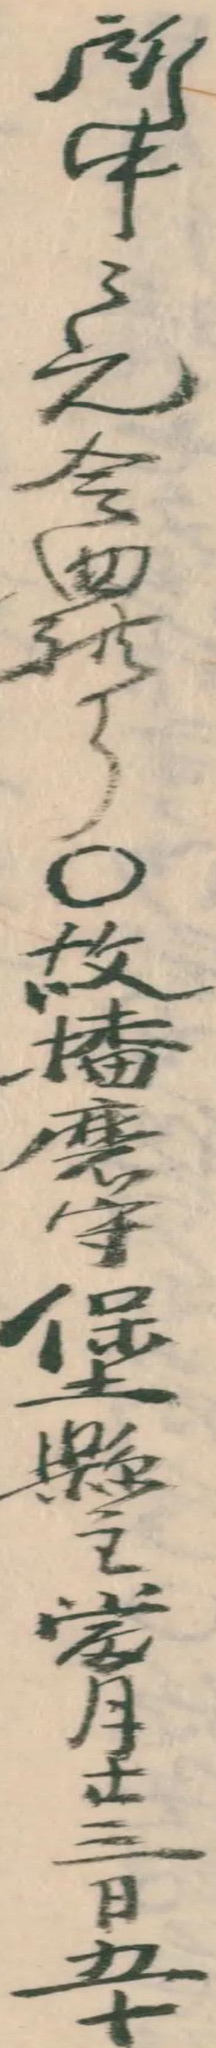所中々元令回禮了〇故播磨守保土縣主當月廿三日五十
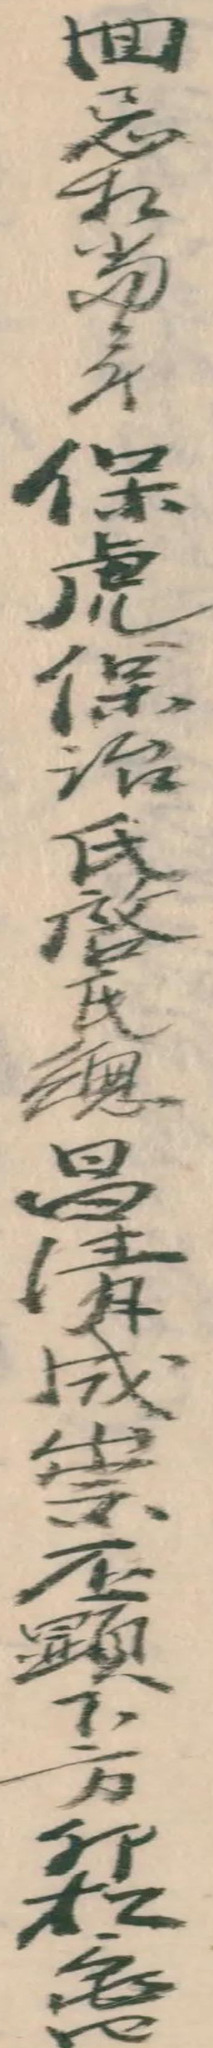回忌相當ニ付保虎保治氏啓氏總昌清成祟丕顕下方外松亀四
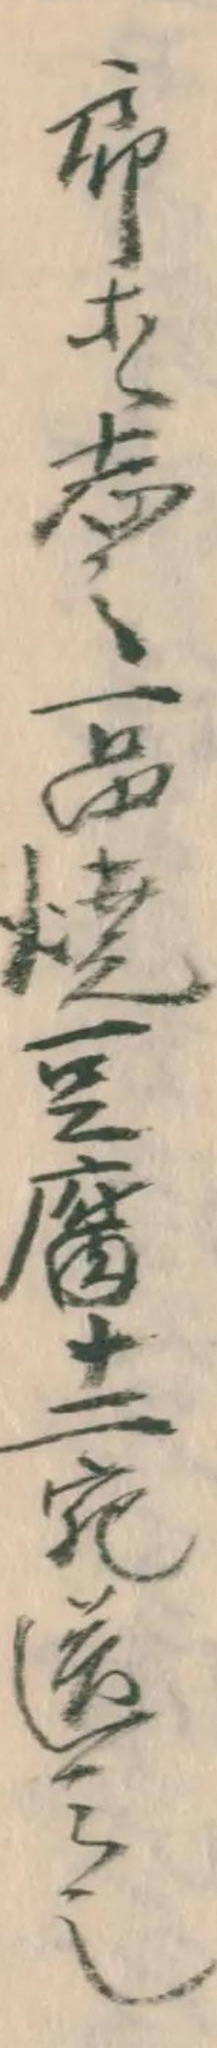郎等へ志之一品焼豆腐十二宛送之也
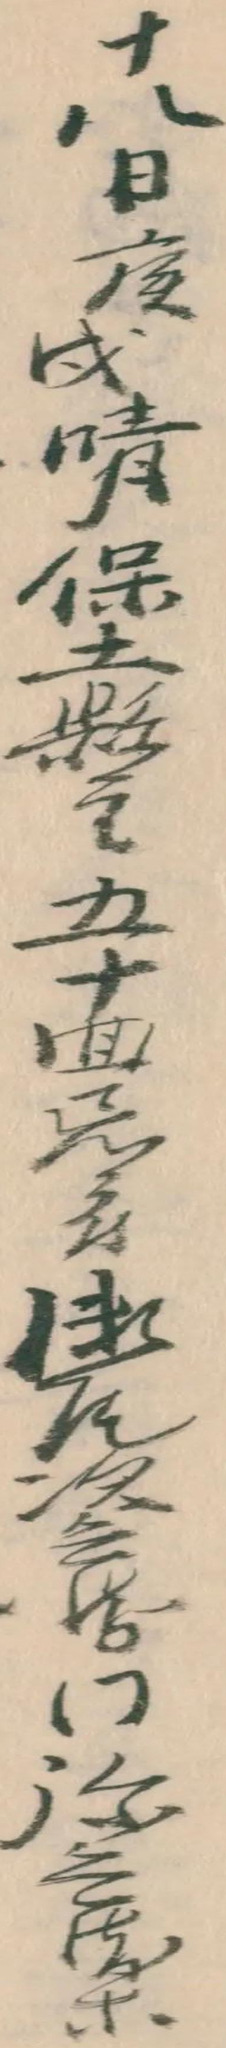十八日庚戌晴保土縣主五十回忌ニ付瀬尾次兵衛同弥兵衛等
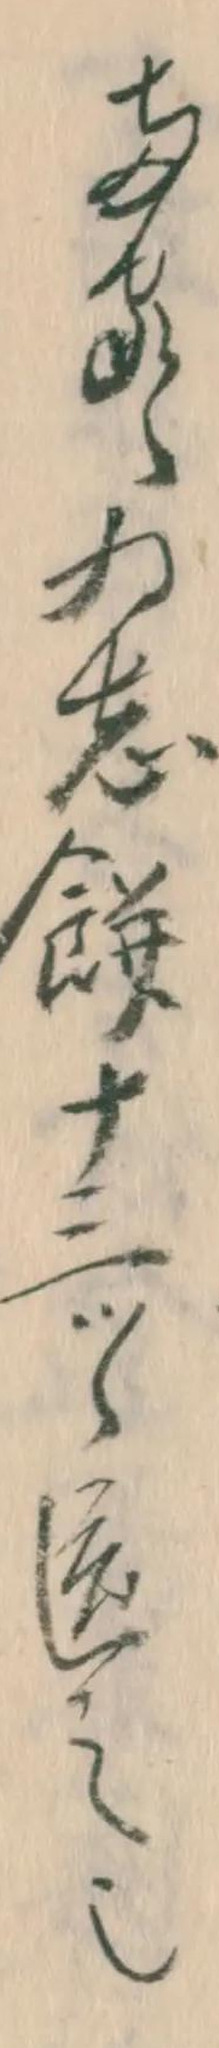両家へ為志餅十三ツヽ送之也
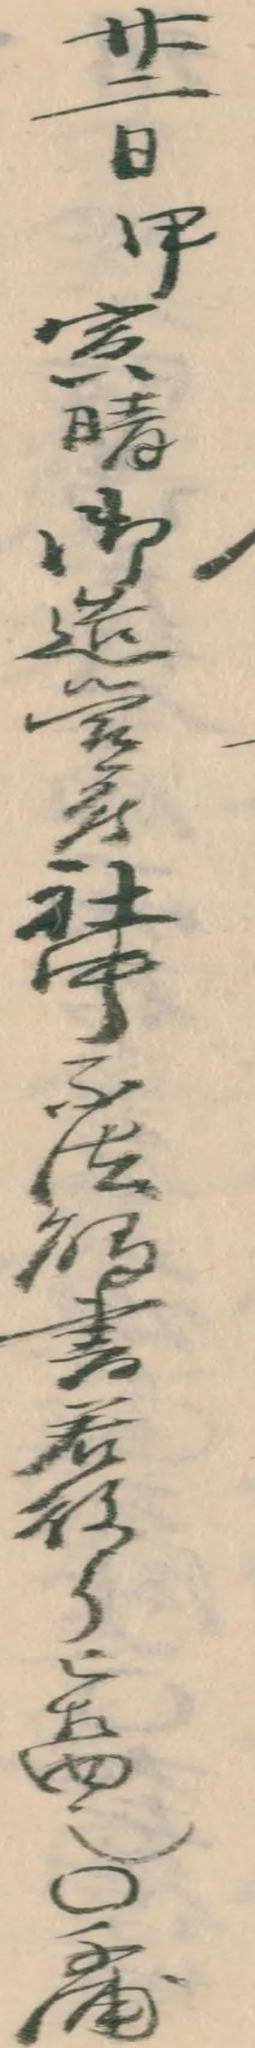廿二日甲寅晴御造営ニ付社中不法觸書若役より被相回也〇千浦
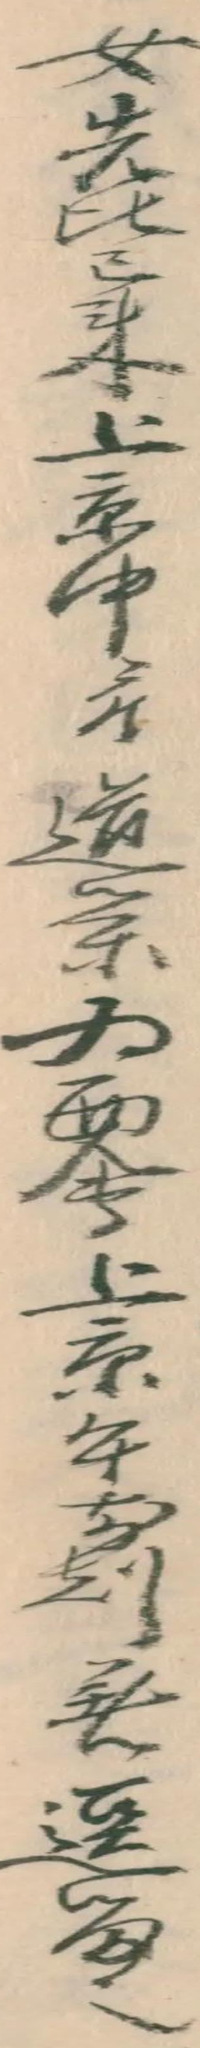女先比已来上京中ニ付道栄為面會上京午前刻兼逗留也
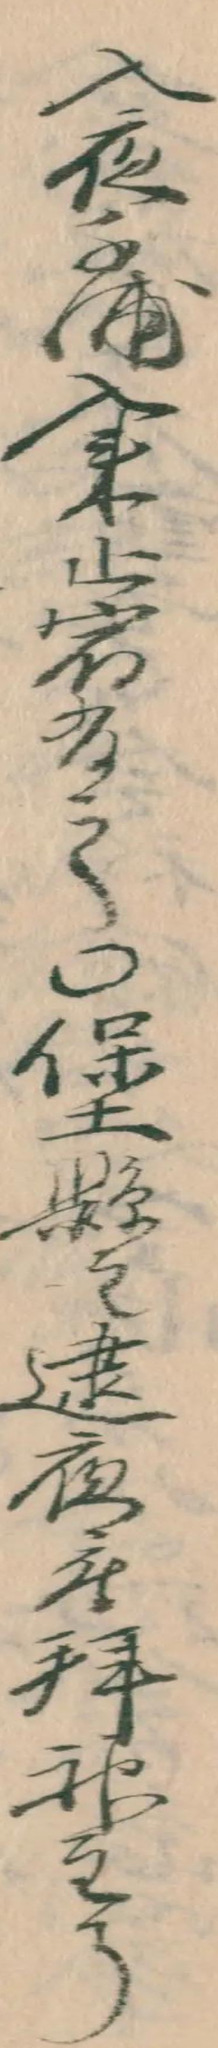入夜千浦入来止宿有之○保土縣主逮夜ニ付拝神主了
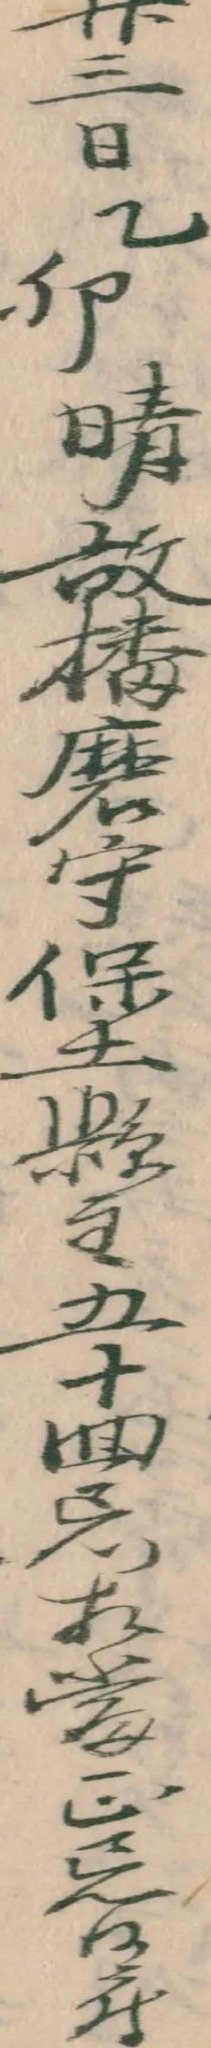廿三日乙卯晴故播磨守保土縣主五十回忌相當正忌候ニ付
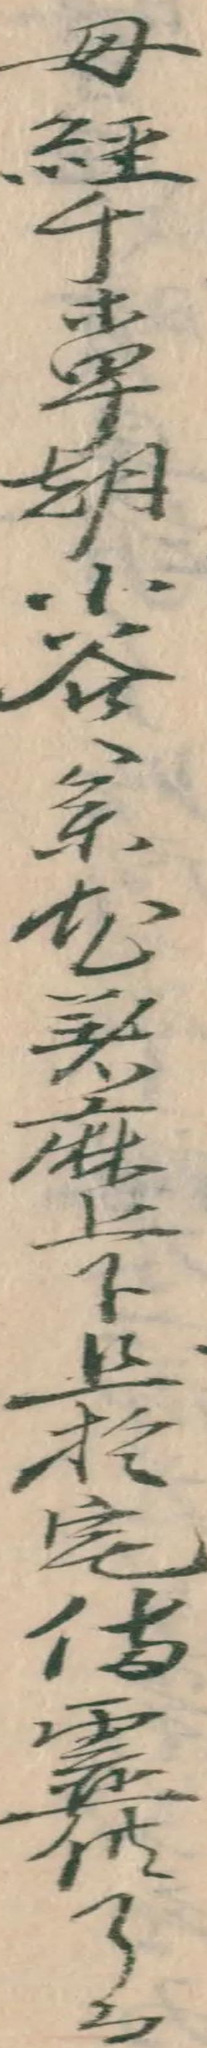母経千等早朝小谷へ参尤着麻上下且於宅備霊供了而
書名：賀茂社記録. 第66冊
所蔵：国立国会図書館 National Diet Library, JAPAN
